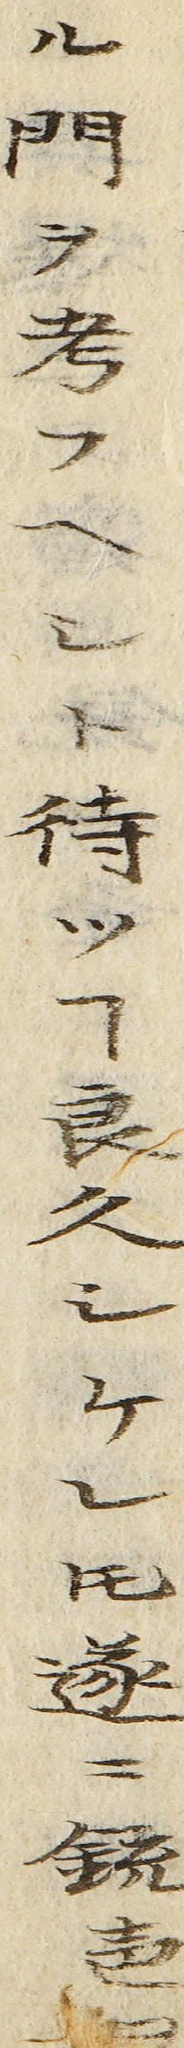ル門ヲ考フヘシト待ツコト良久シケレトモ遂ニ銃声ヲ
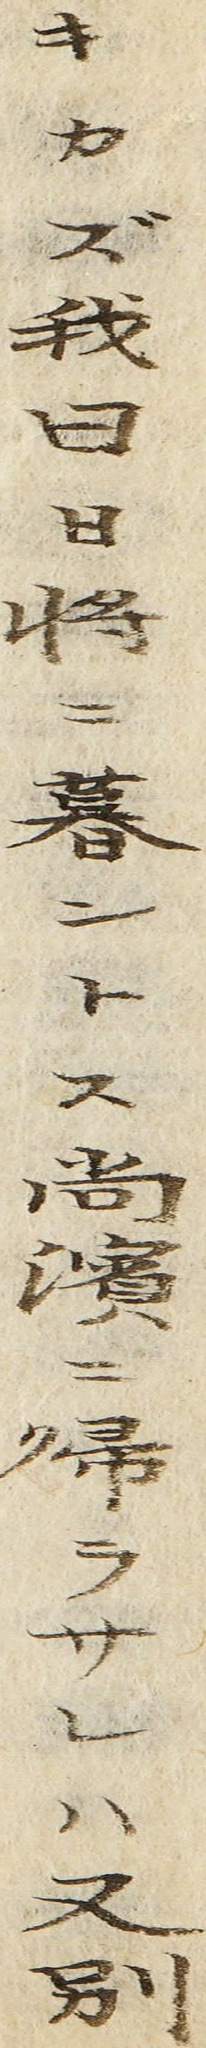キカズ我曰日将ニ暮ントス尚浜ニ帰ラサレハ又別
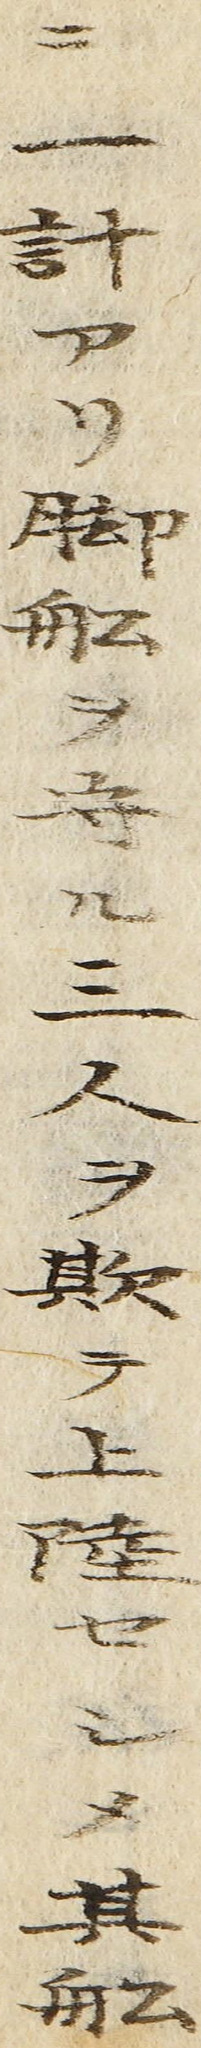ニ一計アリ脚船ヲ守ル三人ヲ欺テ上陸セシメ其船
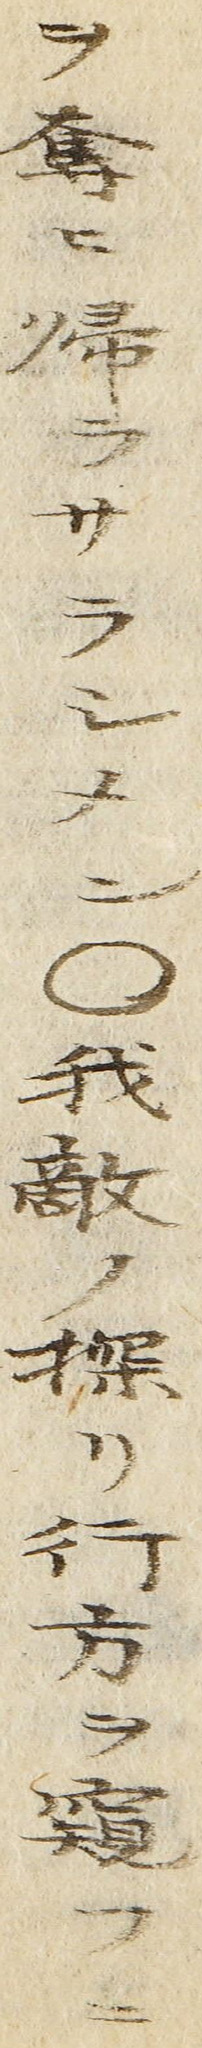ヲ奪ヒ帰ラサラシメン◯我敵ノ探リ行方ヲ窺フニ
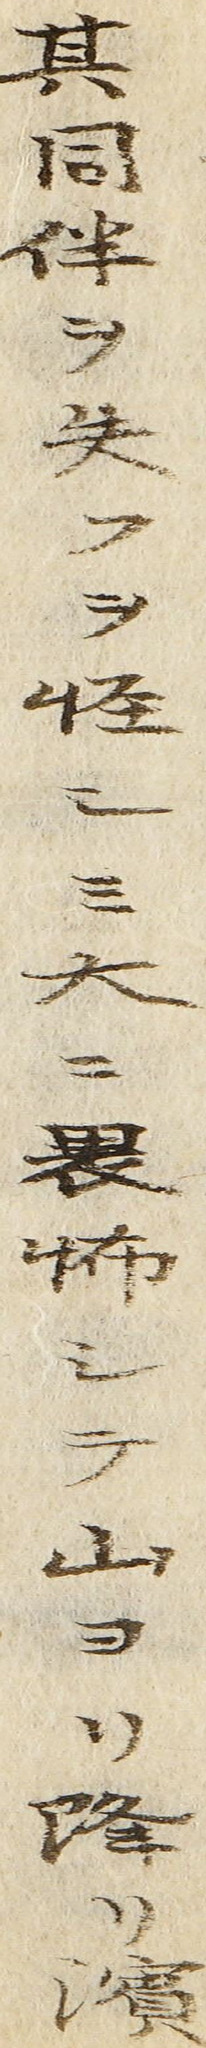其同伴ヲ失フヲ怪シミ大ニ畏怖シテ山ヨリ降リ浜
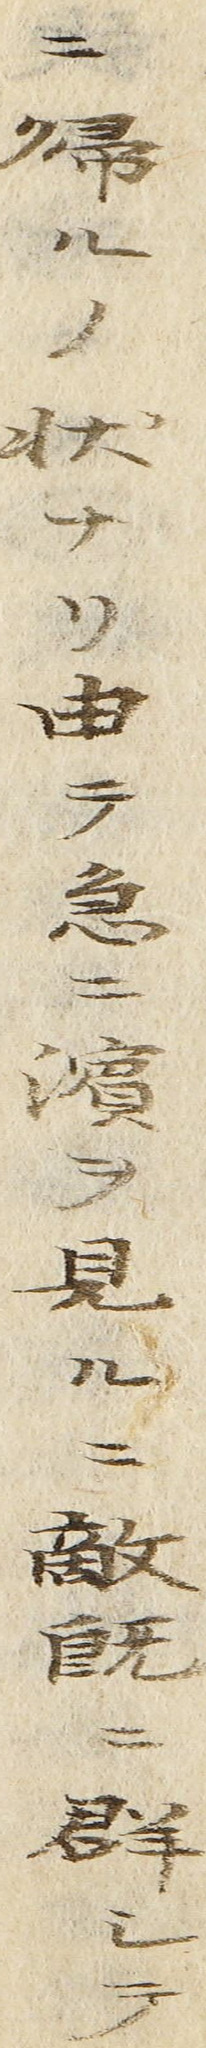ニ帰ルノ状ナリ由テ急ニ浜ヲ見ルニ敵既ニ群シテ
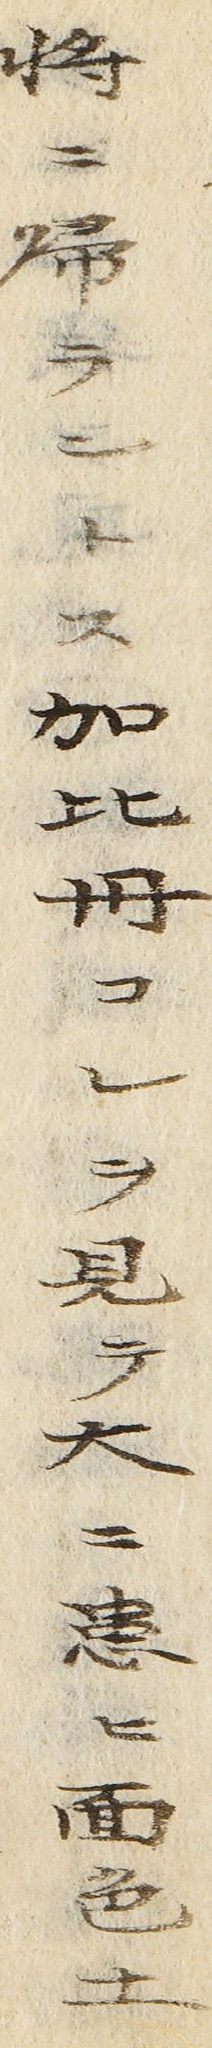将ニ帰ラントス加比丹コレヲ見テ大ニ患ヒ面色土
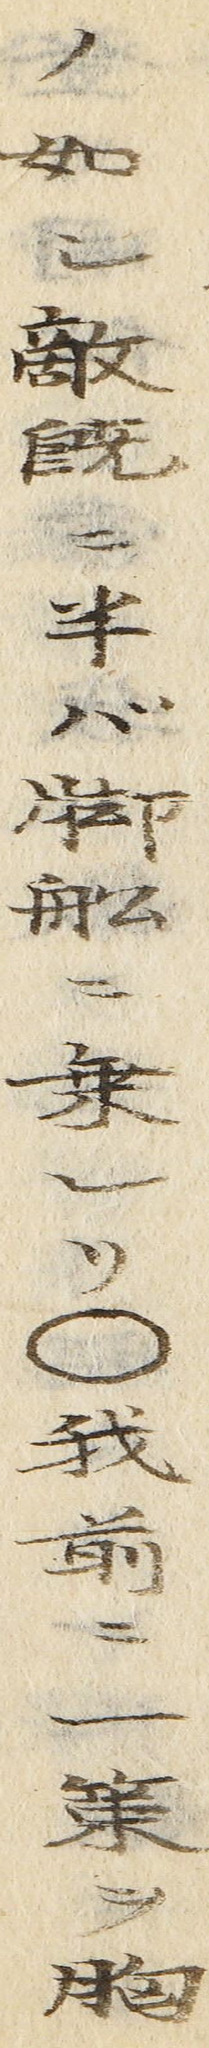ノ如シ敵既ニ半バ脚船ニ乗レリ◯我前ニ一策ヲ胸
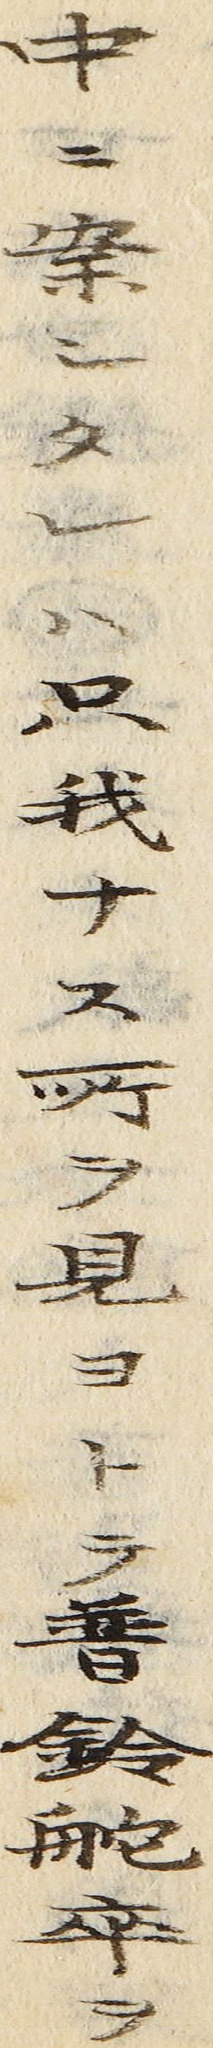中ニ案シタレハ只我ナス所ヲ見ヨトテ普鈴舵卒ヲ
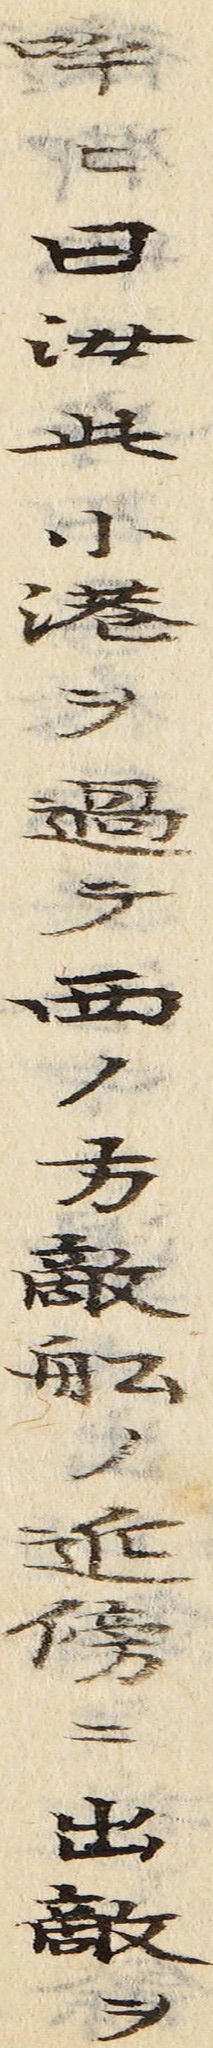呼ヒ曰汝此小港ヲ過テ西ノ方敵船ノ近傍ニ出敵ヲ
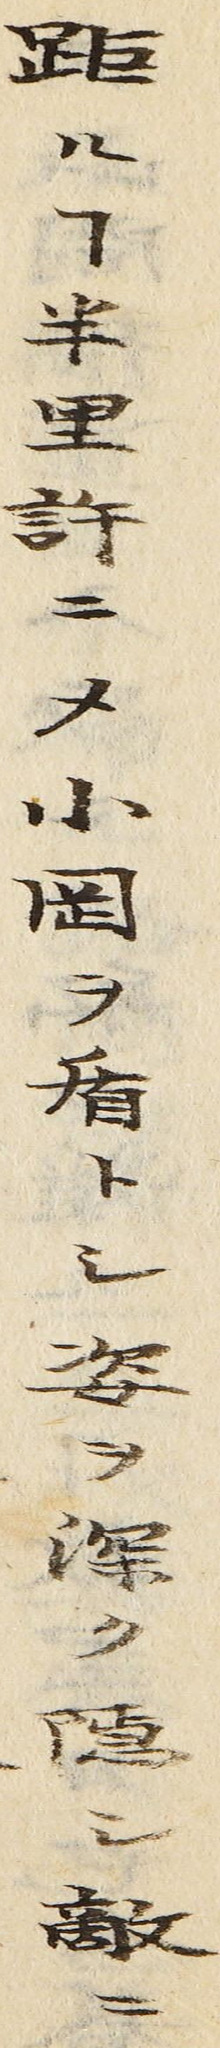距ルコト半里許ニシテ小岡ヲ盾トシ姿ヲ深ク隠シ敵ニ
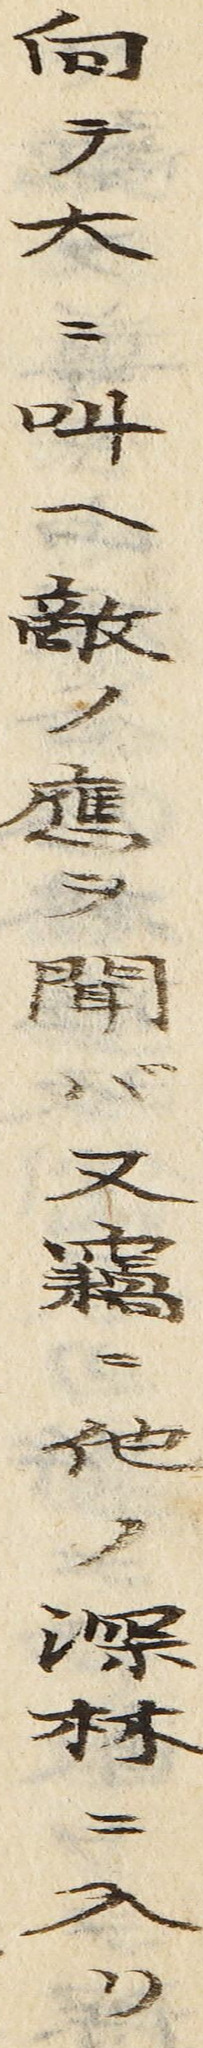向テ大ニ叫ヘ敵ノ応ヲ聞バ又竊ニ他ノ深林ニ入リ
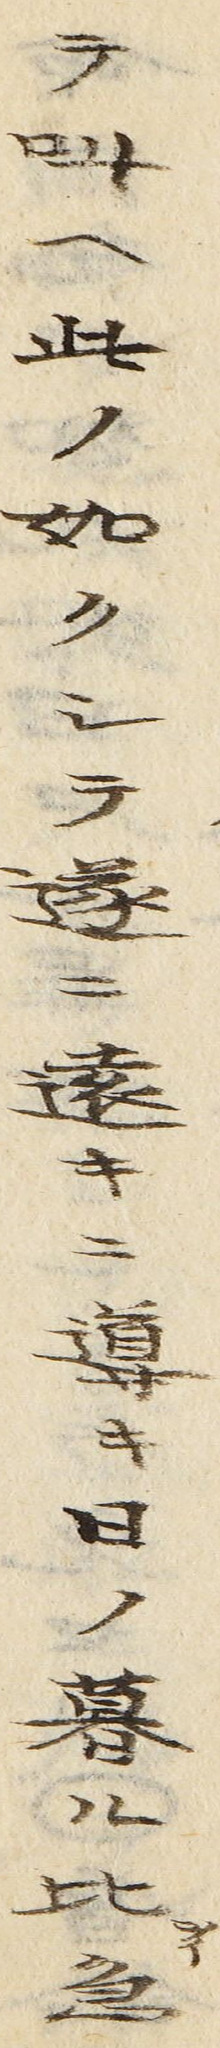テ叫ヘ此ノ如クシテ遂ニ遠キニ導キ日ノ暮ル比急
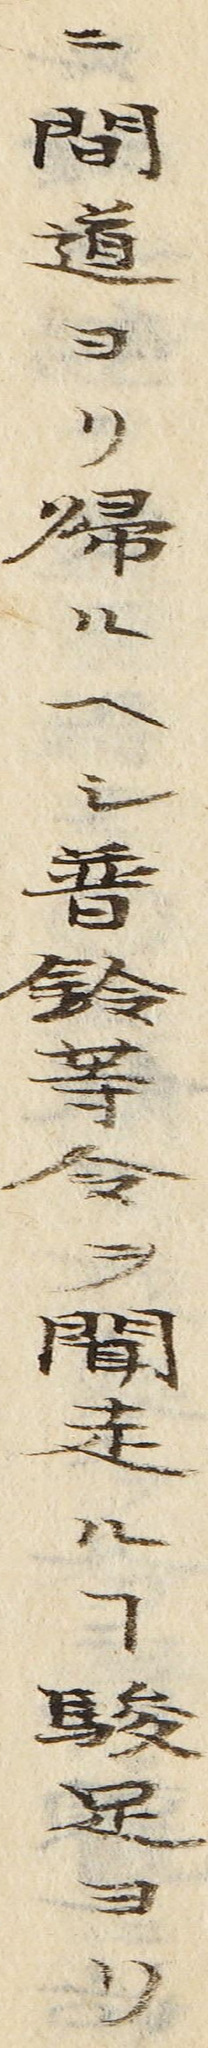ニ間道ヨリ帰ルヘシ普鈴等令ヲ聞走ルコト駿足ヨリ
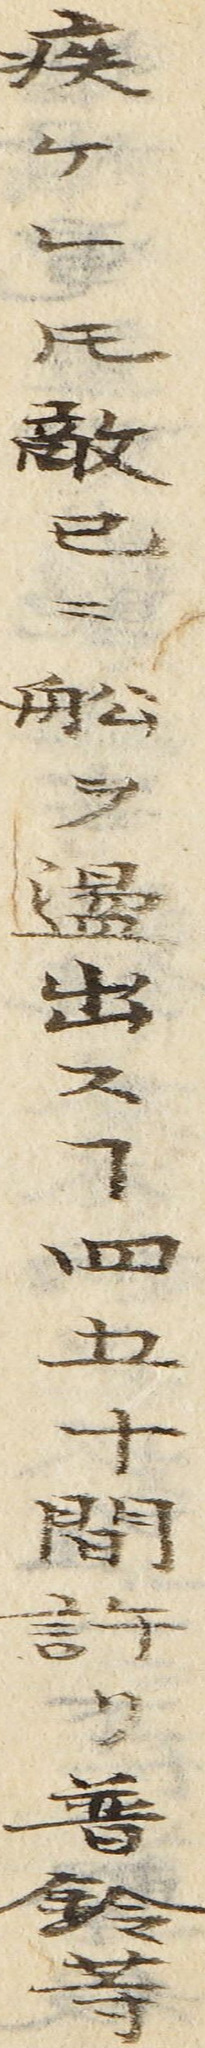疾ケレトモ敵已ニ船ヲ盪出スコト四五間許リ普鈴等
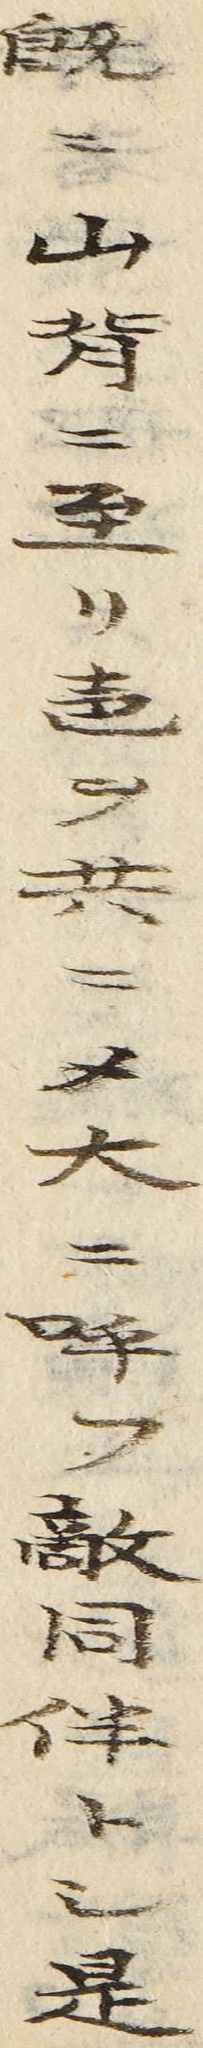既ニ山背ニ至リ声ヲ共ニシテ大ニ呼フ敵同伴トシ是
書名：漂流紀事
